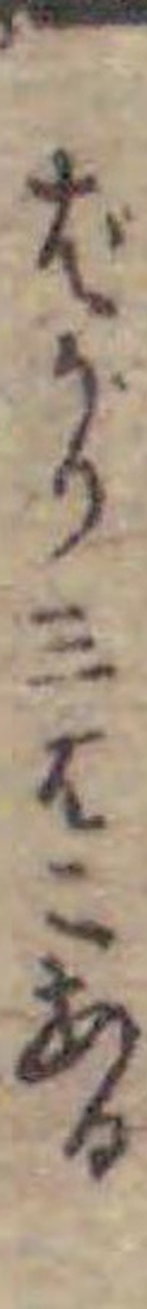ばかり三はこある
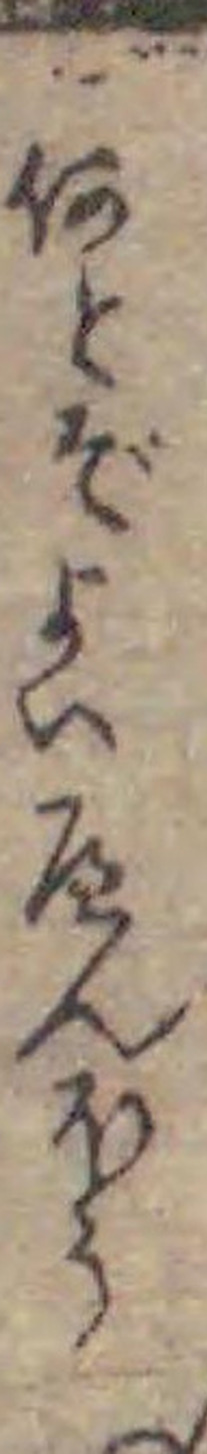何とぞよいへんほう
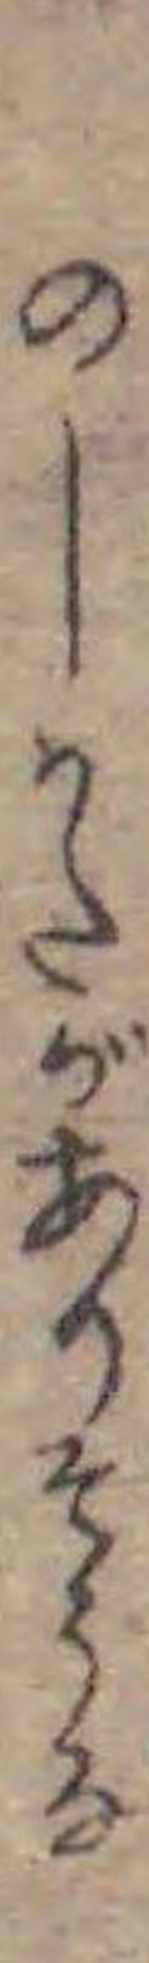のしかたがありそうな
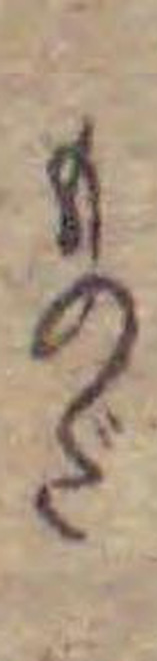ものだ

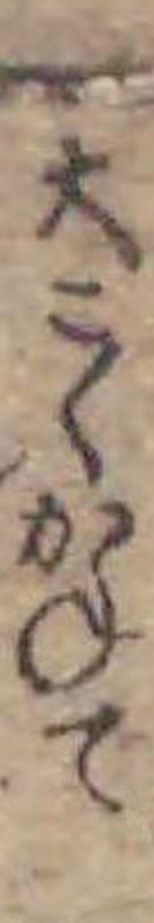大こくかねて
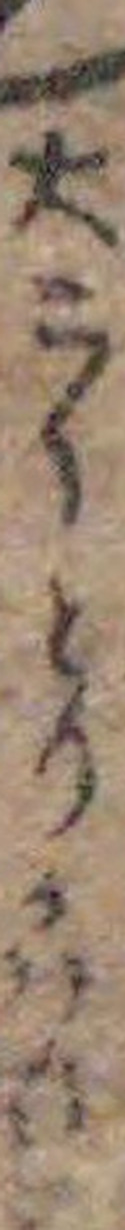大こくとりか……
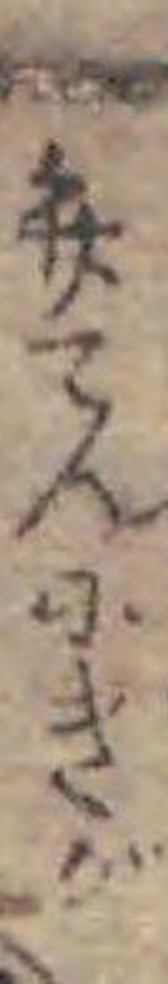弁てんにきが
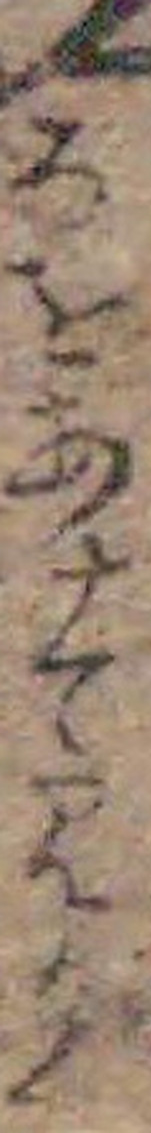ろをあけて見……
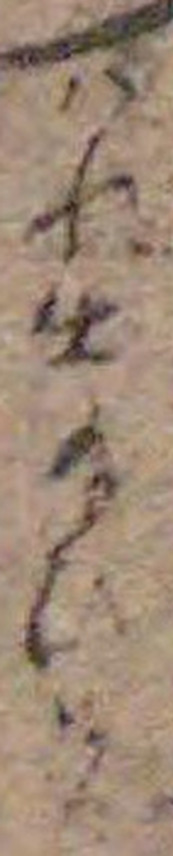はれ出給ひけり
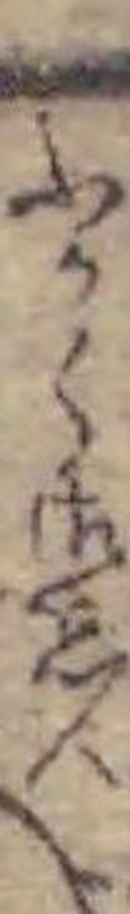ふかく御思？ん
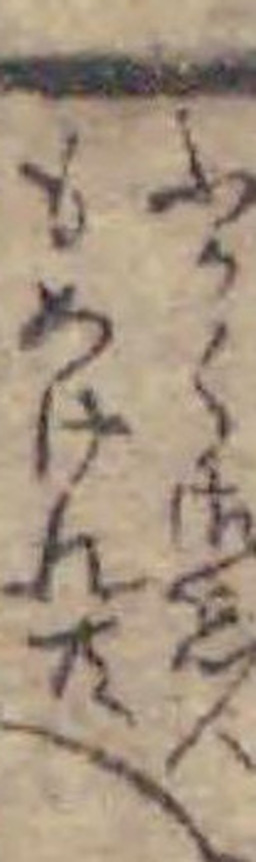もめけれ共
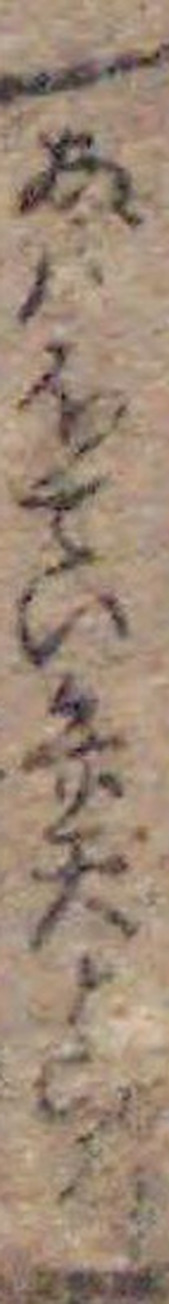扨はほてい弁天と……
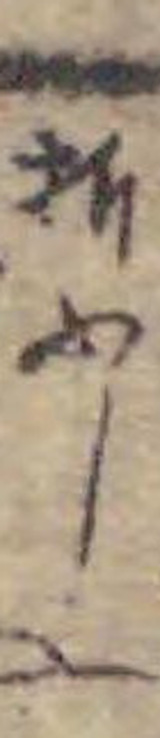折ふし
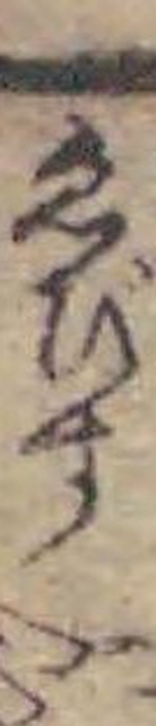ゑびす
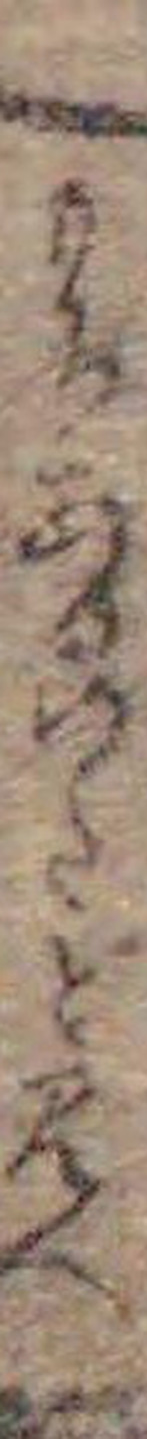もあるいたど見へ
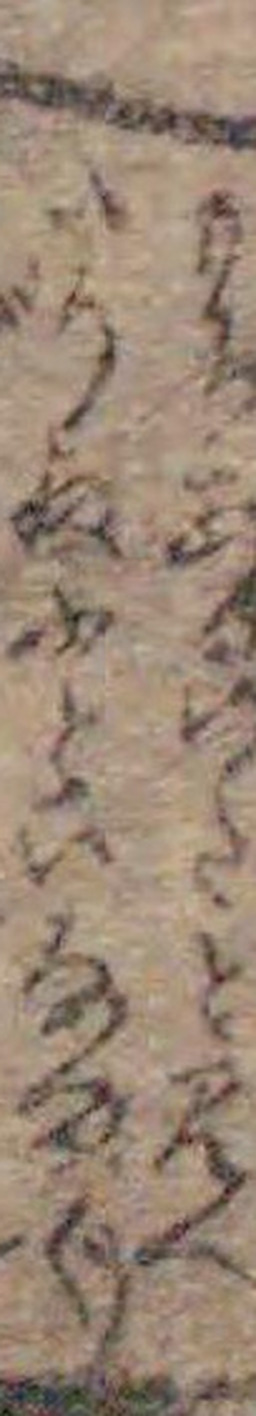けり扨ふといなまぐ
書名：蛭子大黒壮年過 : 2巻
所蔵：国立国会図書館 National Diet Library, JAPAN
